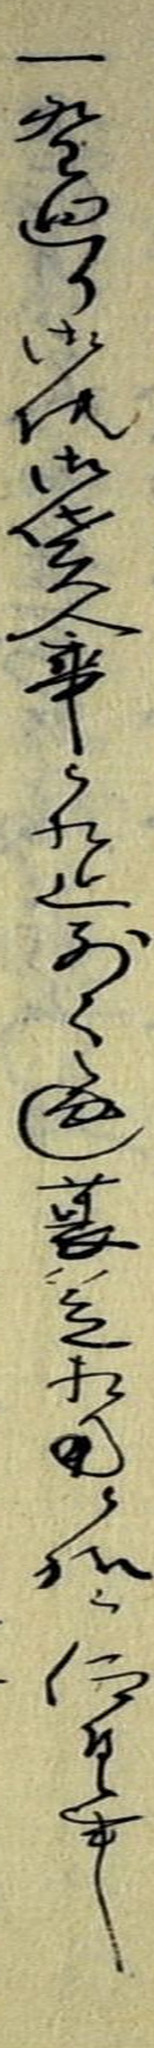一野廻り御供御貸傘被相止前々之通簔笠相用候様被仰付候事
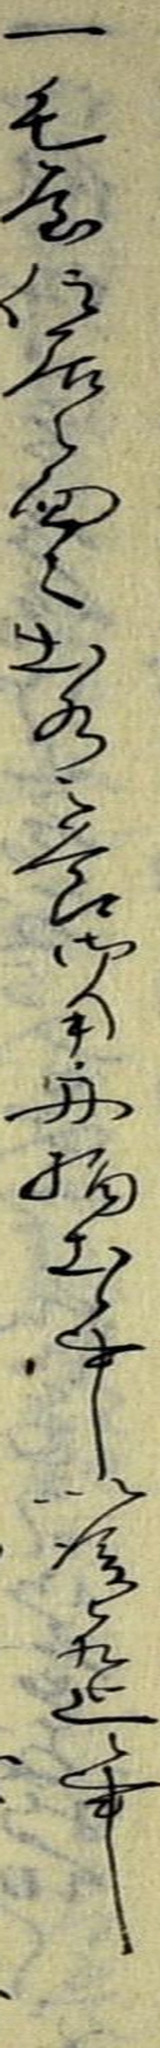一毛屋住居之面々出水之節御用舟指出候事以後被相止候事
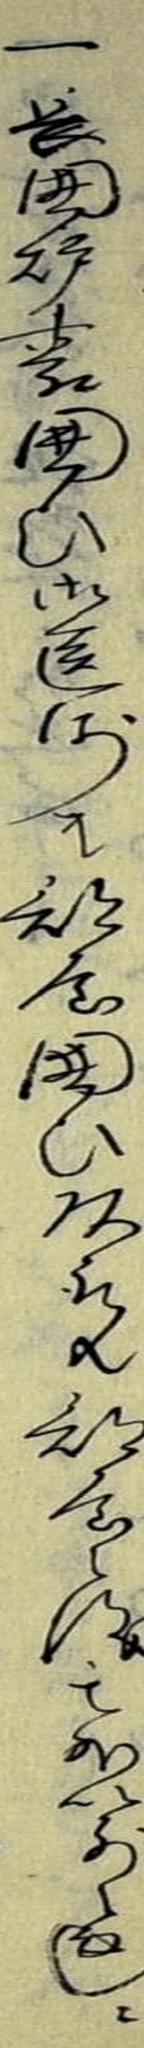一長囲炉裏囲ひ御医師共部屋囲ひ頭取共部屋之儀其外以前之通に
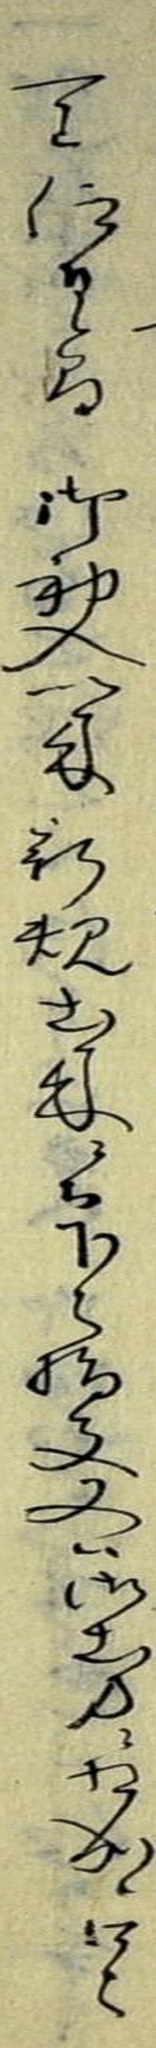可被仰付候間御初入以来新規出来に而下之指支又は御出方に相成候口々
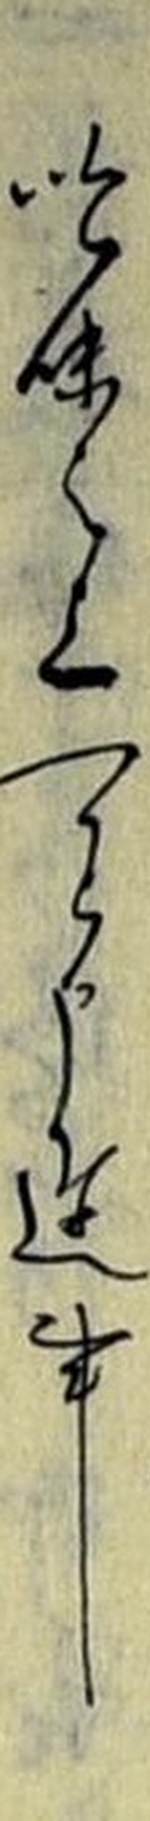吟味之上可被申達事
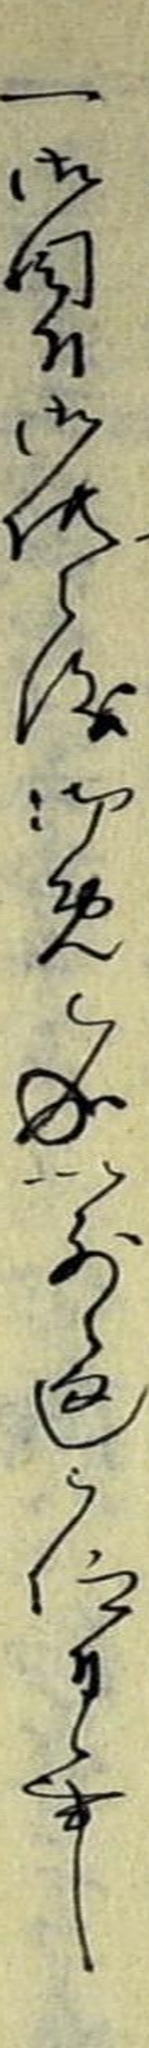一御目付御供之儀御免被成以前之通被仰付候事
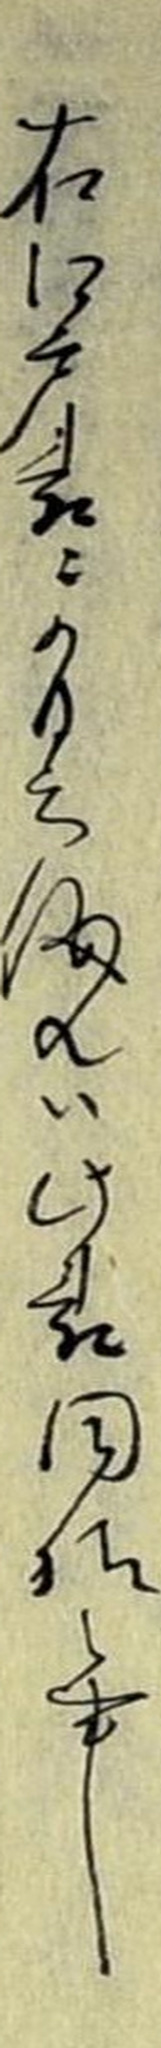右江戸表に有之儀共は此表同様之事
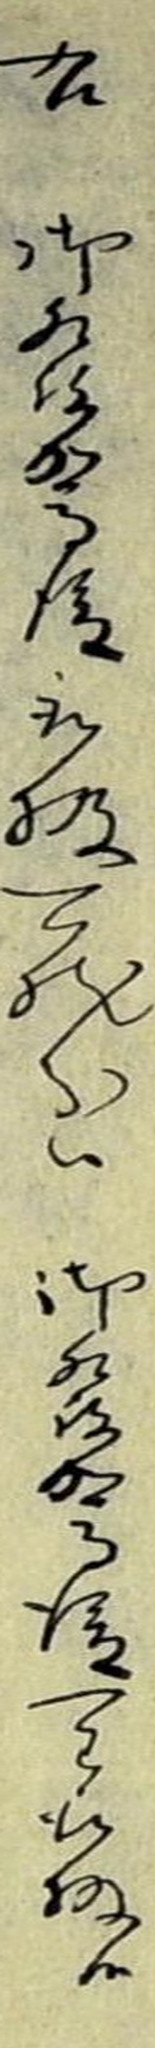右御発駕後取扱可然分は御発駕後可被取扱候
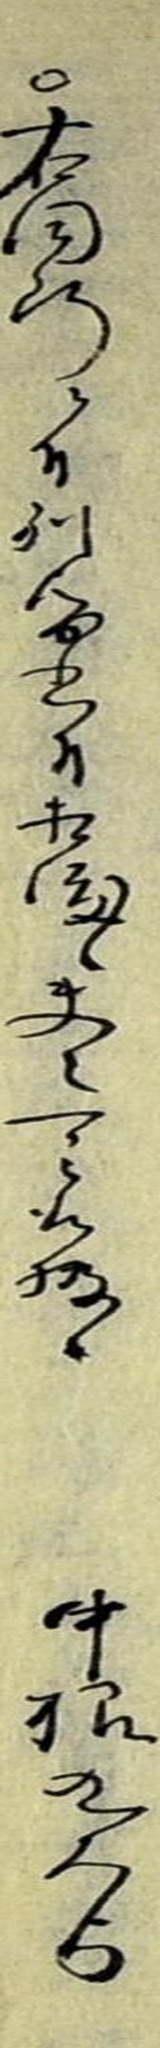〇右同断に付別紙書付相渡候夫々可被取扱候中根九右衛門
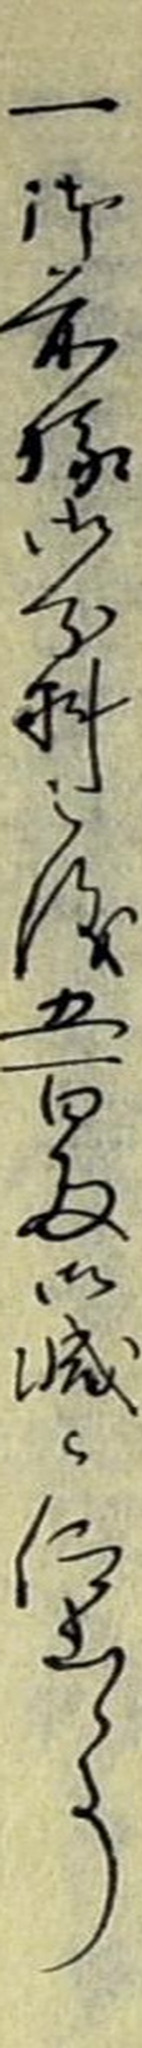一御前様御分料之儀五百両御減被仰出候事
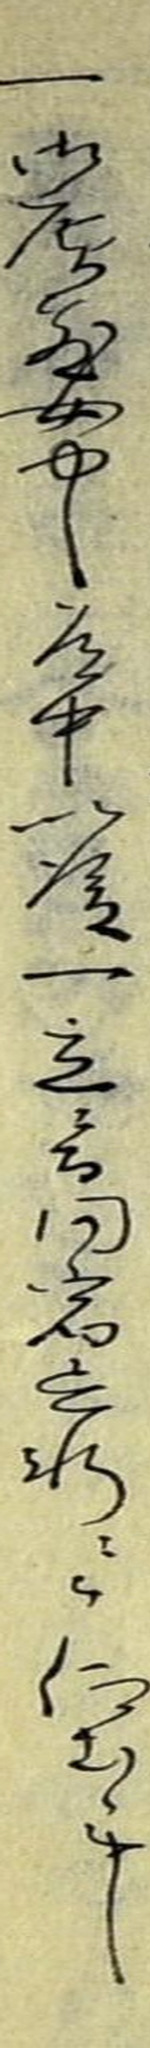一御広敷女中道中以後一立に而同宿壱軒に被仰出候事
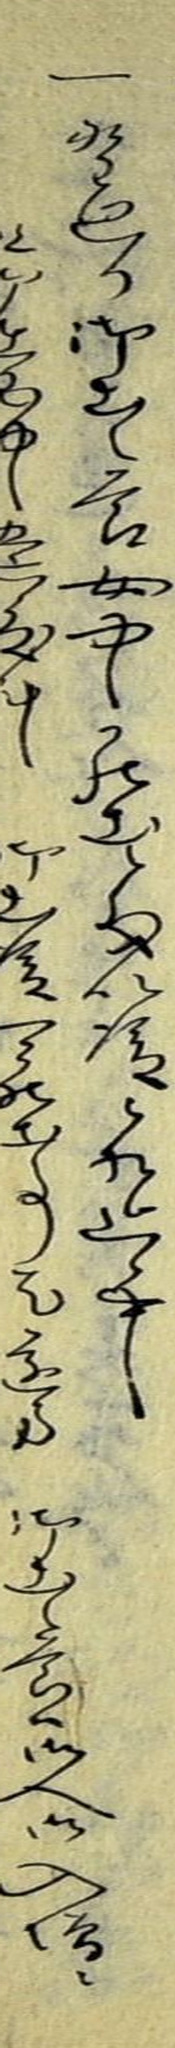一野廻り御出之節女中罷出之義以後被相止候事
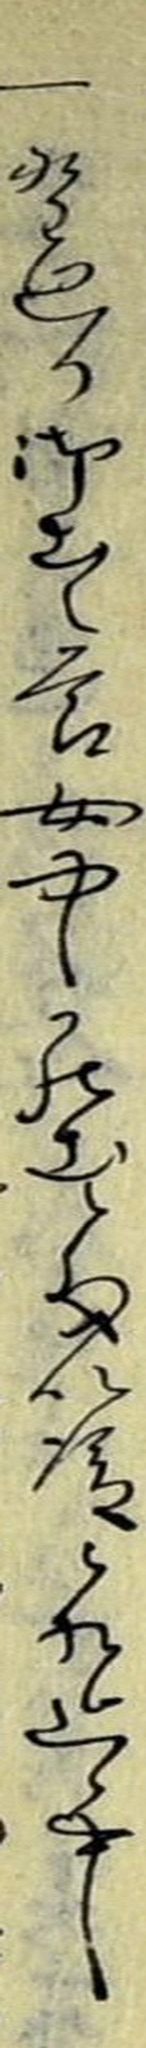一野廻り御出之節女中罷出之義以後被相止候事
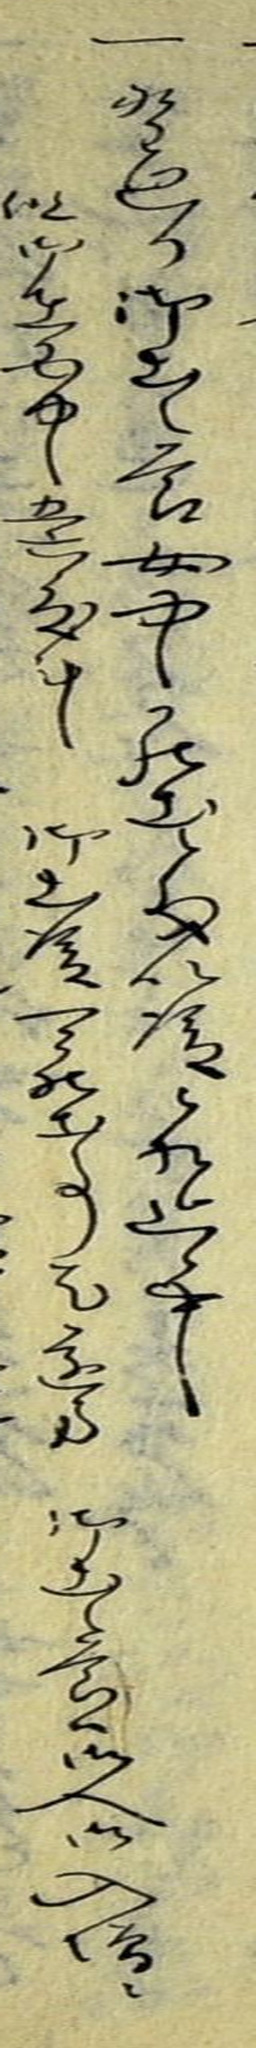但御在国中五六度斗御出後可罷出事尤遠方御出之節は御人御入増に
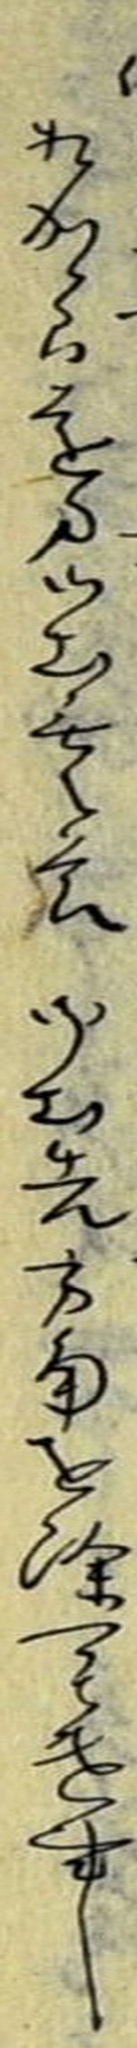相成候間遠方御出無之節御出先方角を除可被遣事

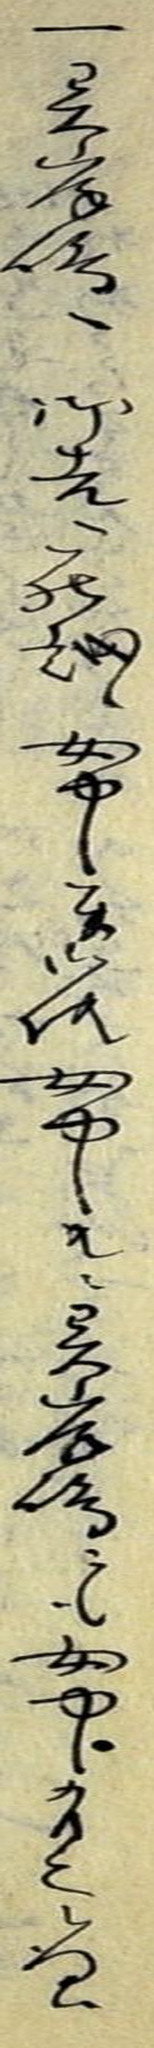一霊岸嶋へ御先へ罷越候女中并御供女中共に霊岸嶋にも女中有之候得は
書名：命令之部 二
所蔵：福井県文書館 Fukui Prefectural Archives
